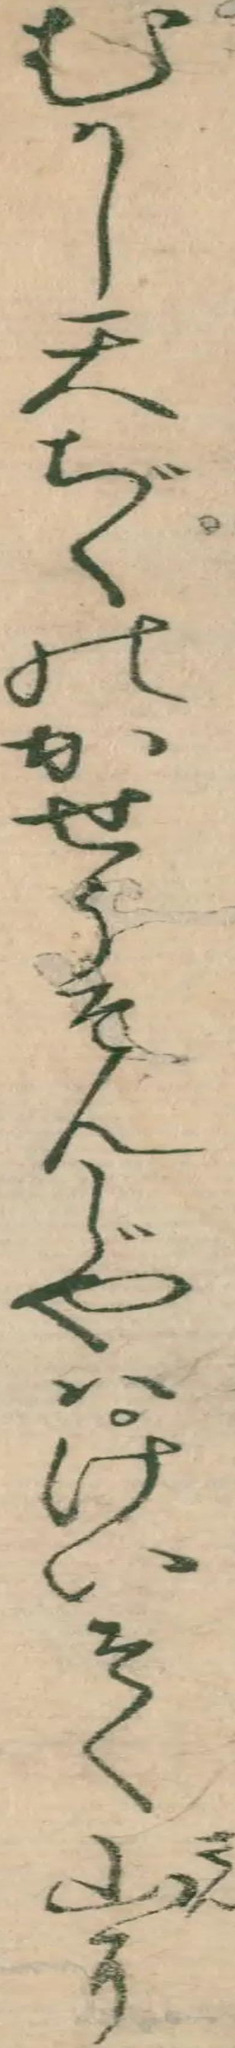むかし天ぢくのかせうそんじやは。けいそく山に
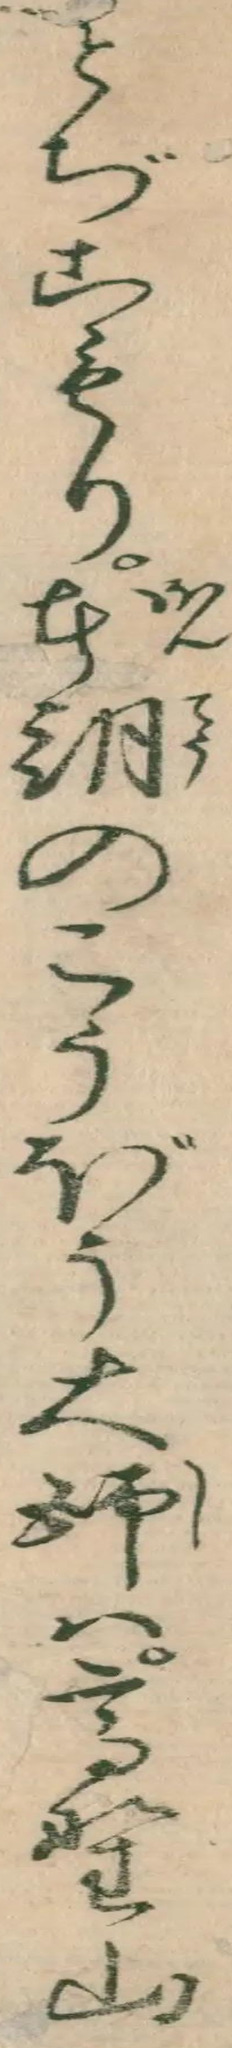とぢこもり。本朝のこうぼう大師は。高野山
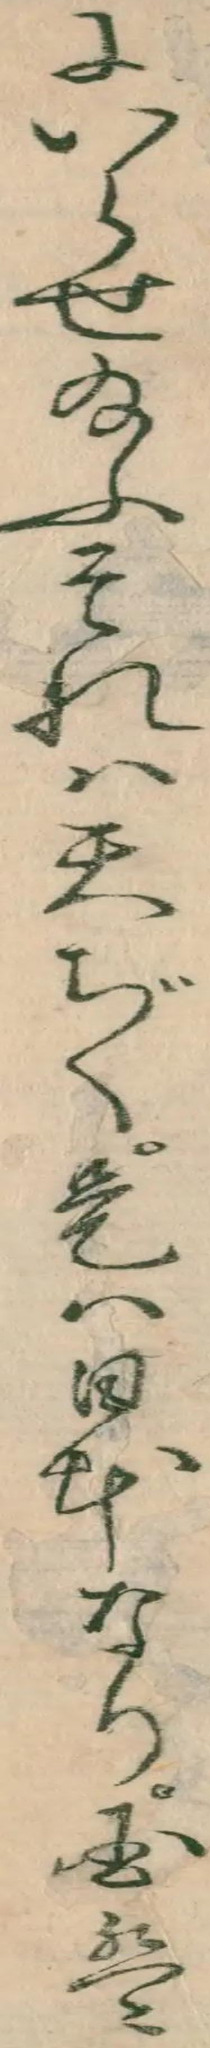にいらせ給ふそれは天ぢく。是は日本なり。国は
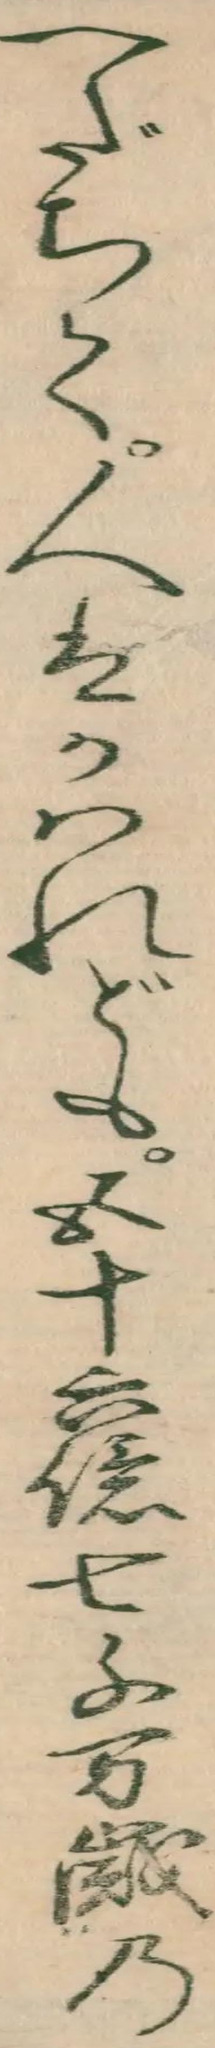へだちて。人はかはれども。五十六億七千万歳の
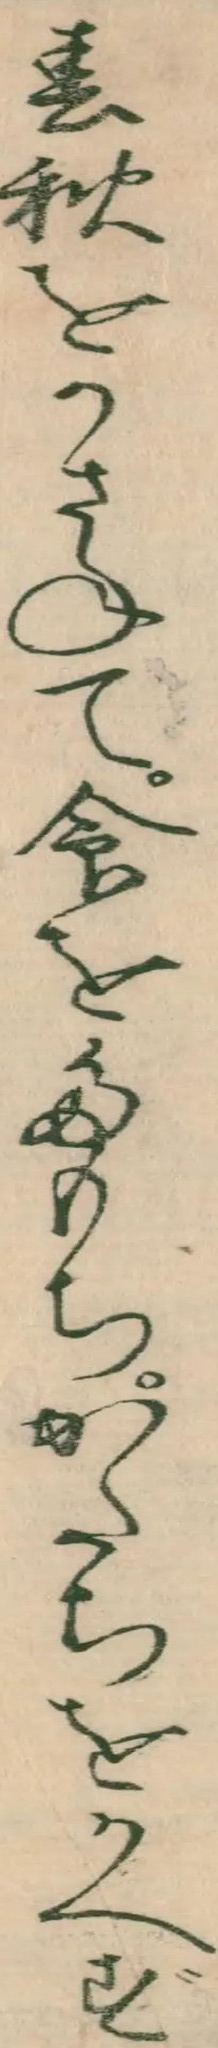春秋をかさねて。命をたもち。かたちをかへず
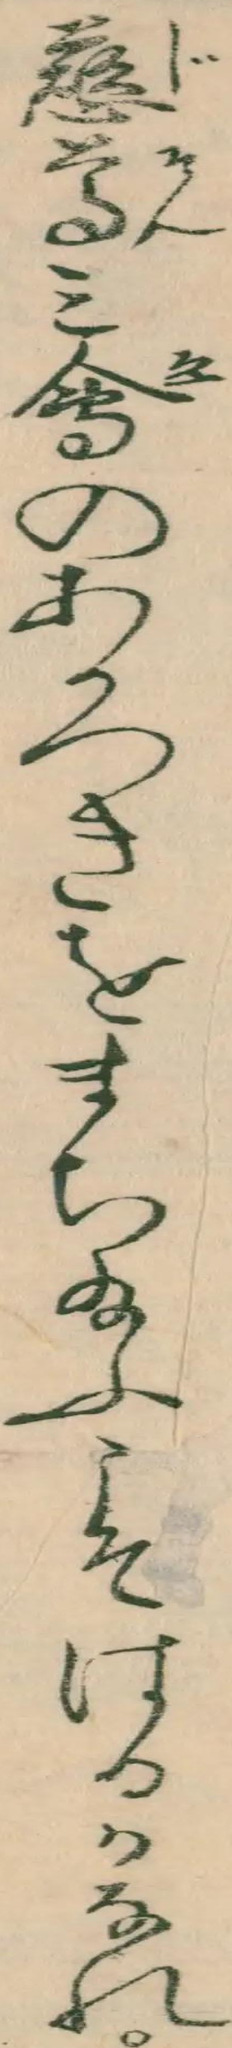慈尊三会のあかつきをまち給ふこそはるかなれ。
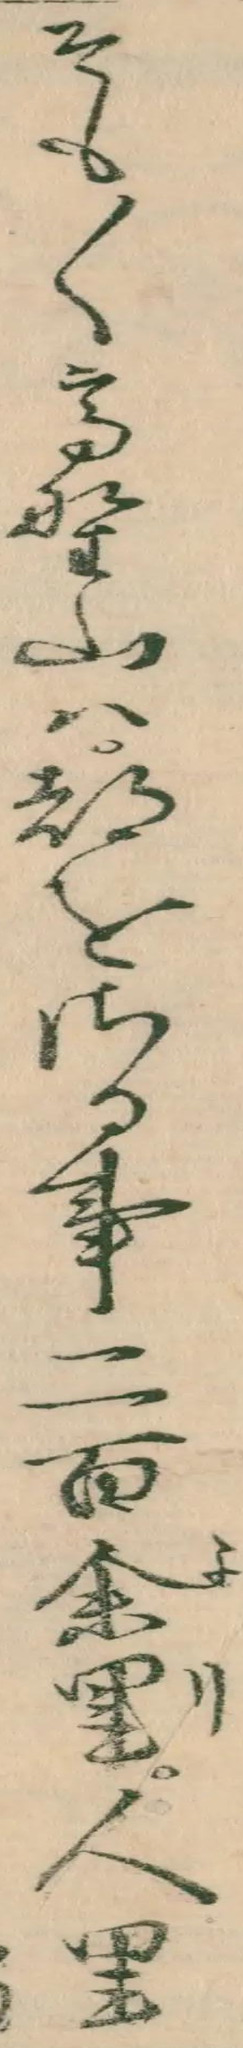そもそも高野山は。都をさる事二百余里。人里
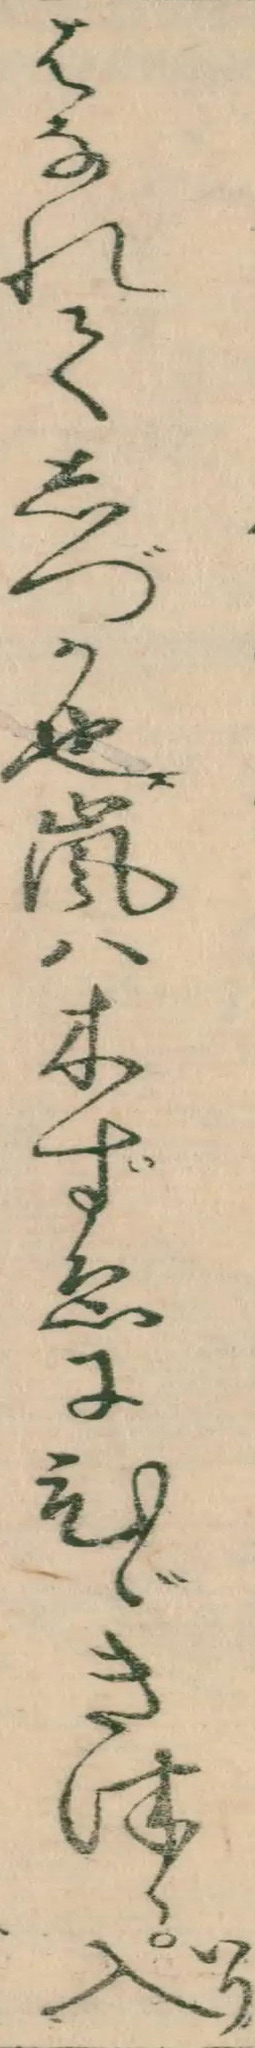はなれてしづか也。嵐は木ずゑにひゞきつゝ。入
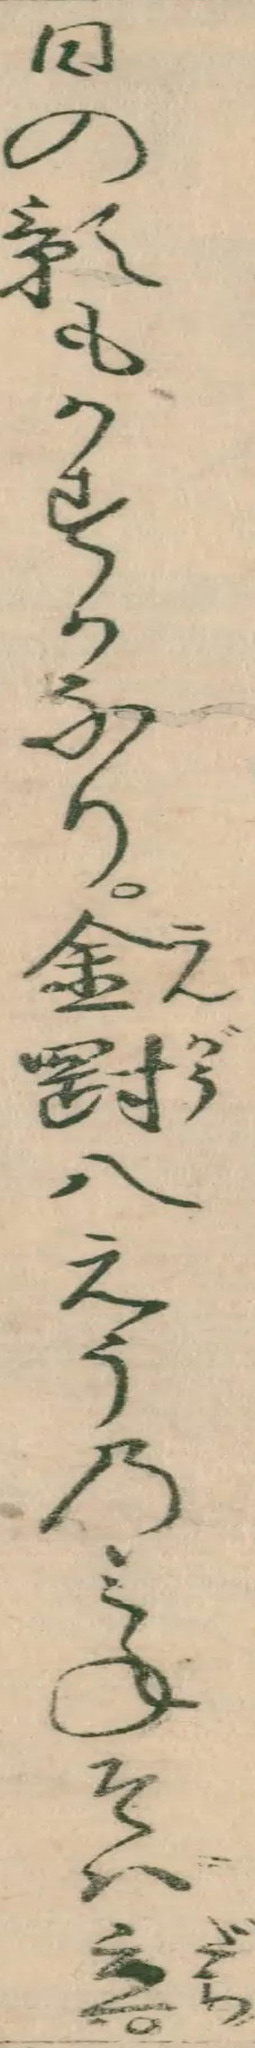日の影もかすかなり。金剛八えうのみねそば立。
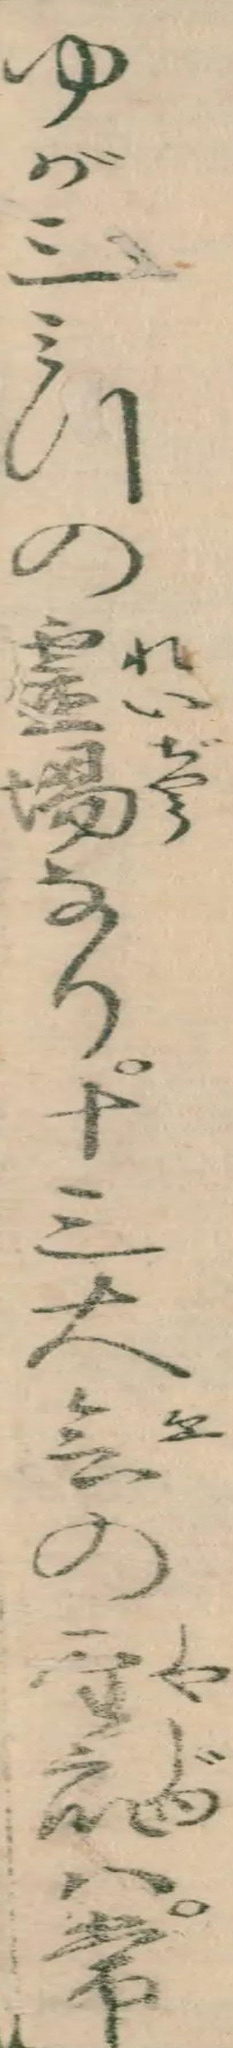ゆが三みつの霊場なり。十三大会の聖衆は。常
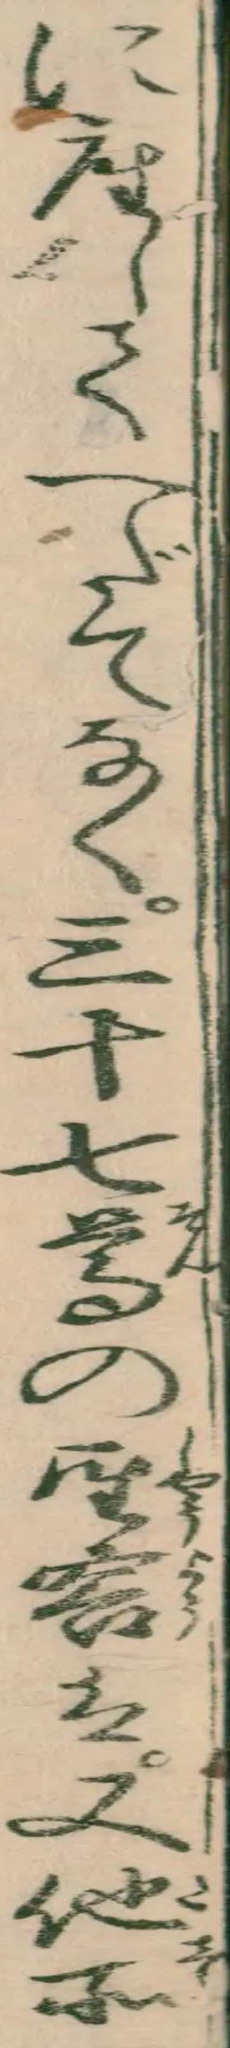に座してへだてなく。三十七尊の聖容は。又他所
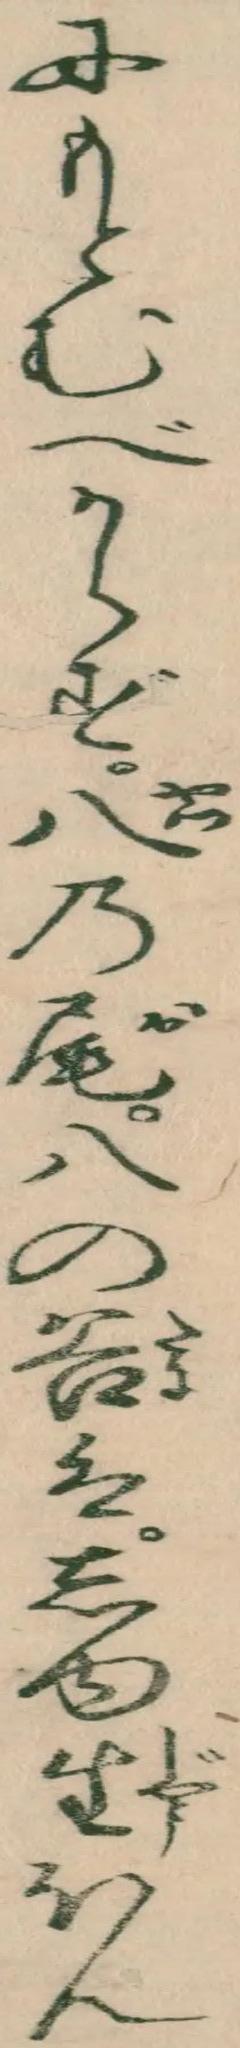にもとむべからず。八の尾。八の谷は。しゆ生ほん
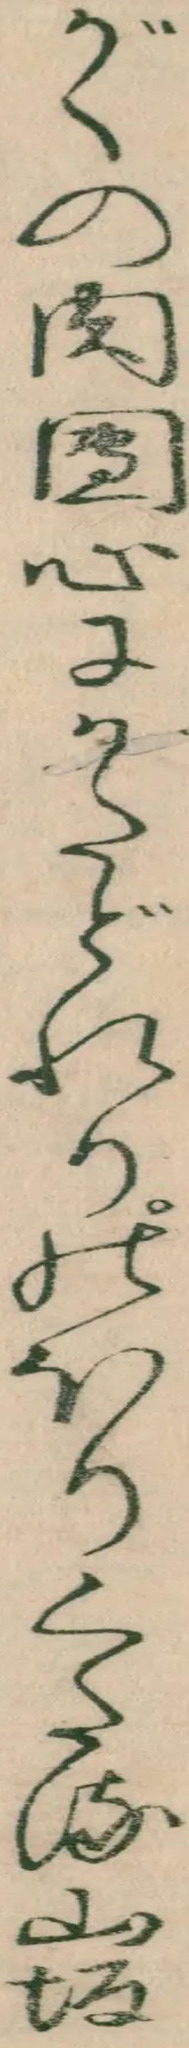がくの肉団心にかたどれり。のほりくたる山坂
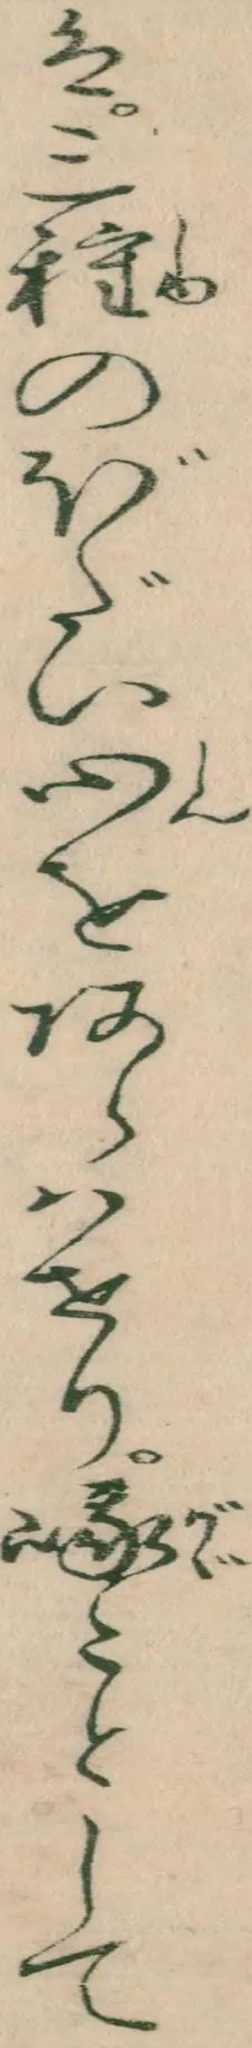は。三種のぼだい心をあらはせり。峨々として
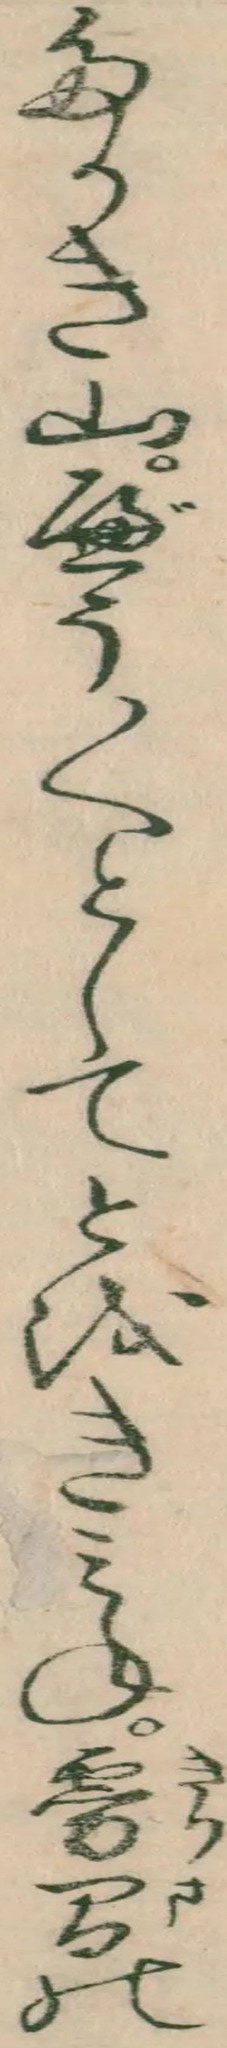たかき山。べう〳〵としてとをきみね。霧間の
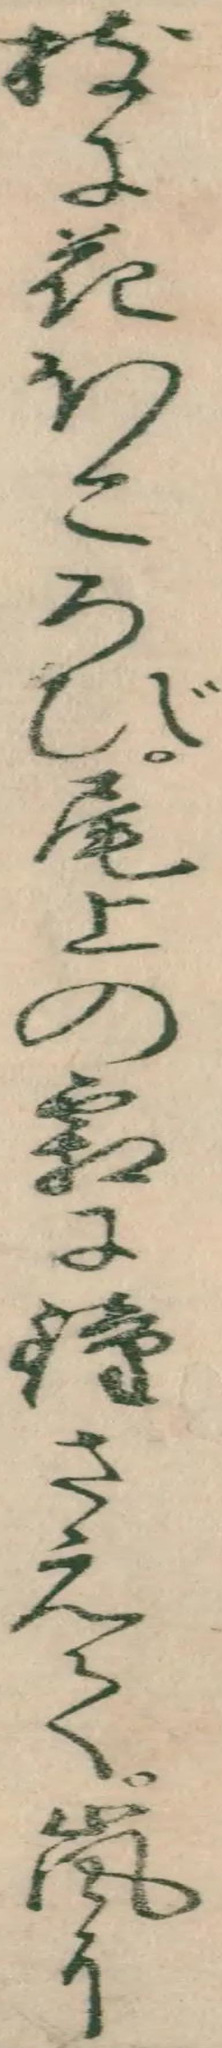枝に花ほころび。尾上の霜に鐘さえて。嵐に
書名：弘法大師御本地 3巻. [3]
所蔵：国立国会図書館 National Diet Library, JAPAN
